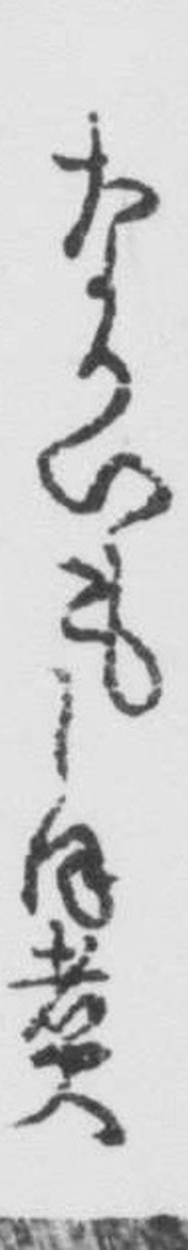なかいもしほ煮
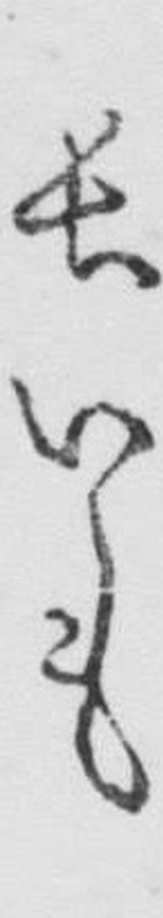長いも
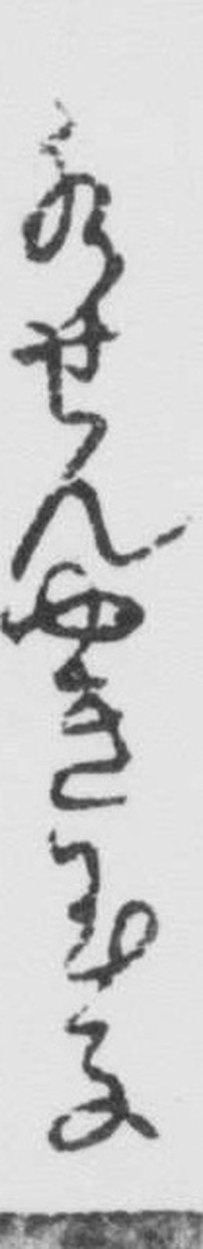水せんやき玉子
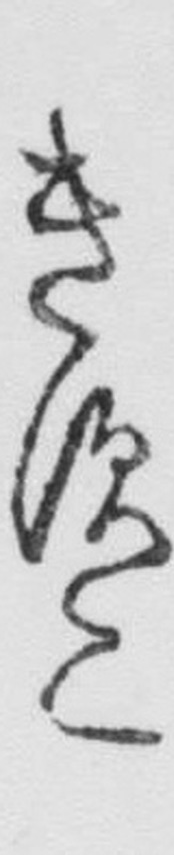きすこ
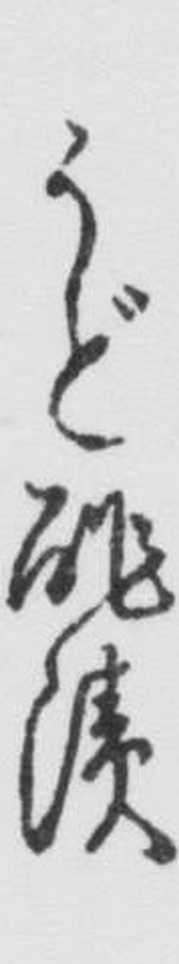うど酢漬
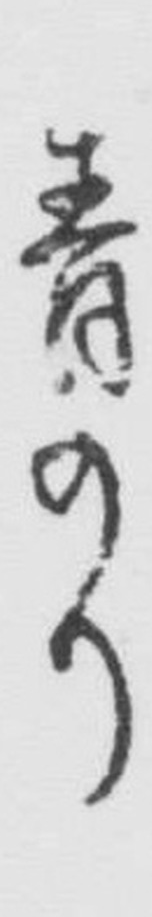青のり
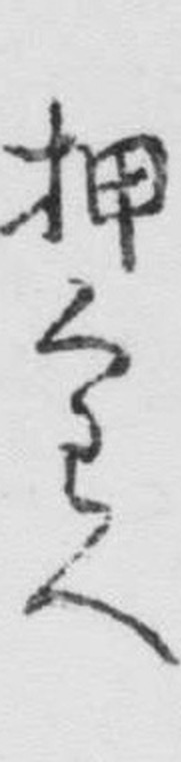押くわへ
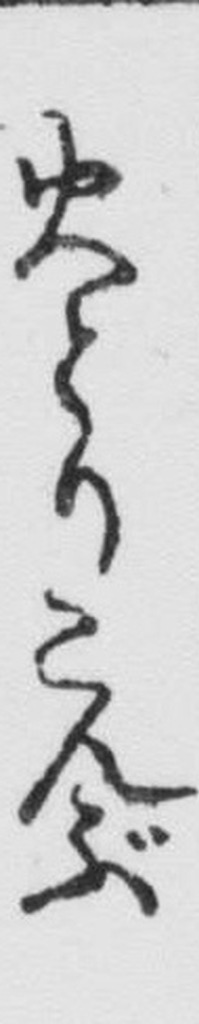火とりこんぶ
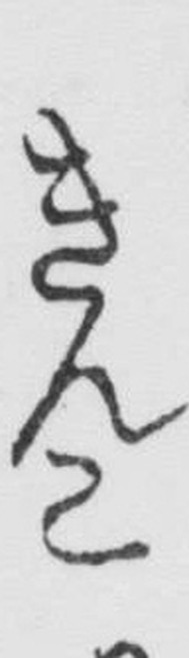きすこ
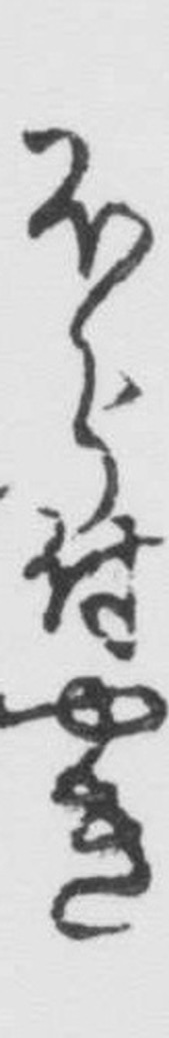ほら付やき
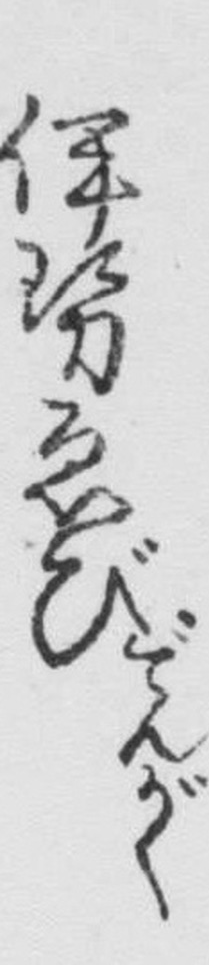伊勢ゑびでんがく
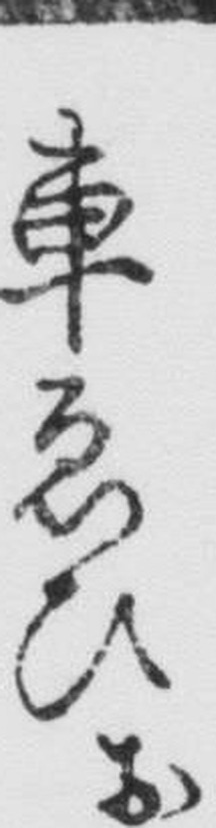車ゑび
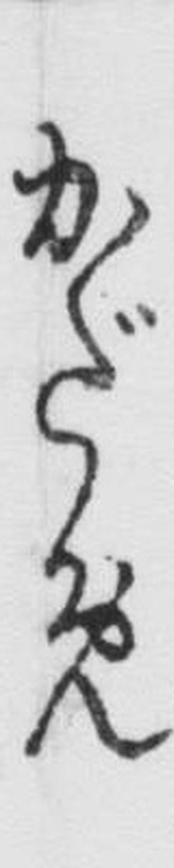かだめ
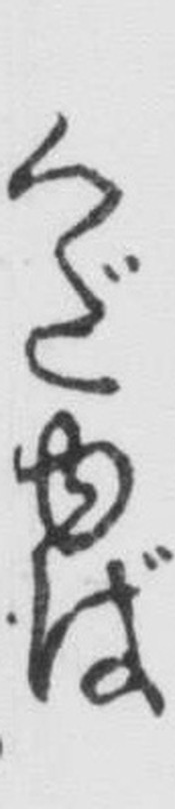くだゆば
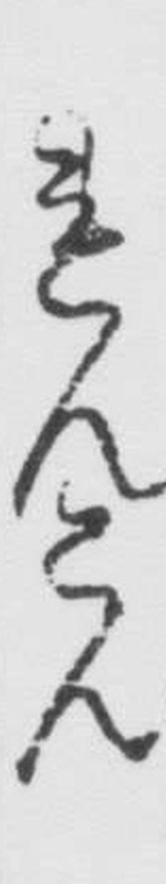れんこん
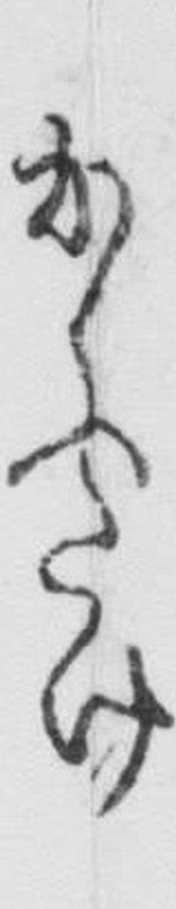かふたけ
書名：諸家通用/即席料理
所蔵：大阪府立大学学術情報センター 国文学研究資料館
